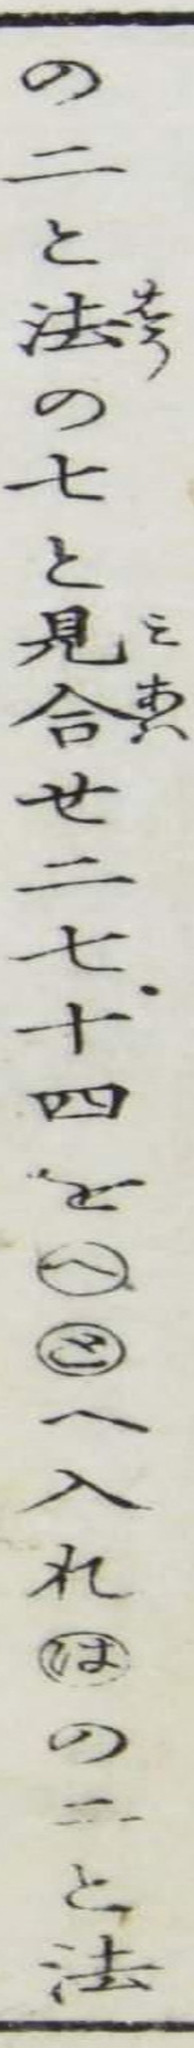の二と法の七と見合せ二七．十四を㋬㋣へ入れ㋩の二と法
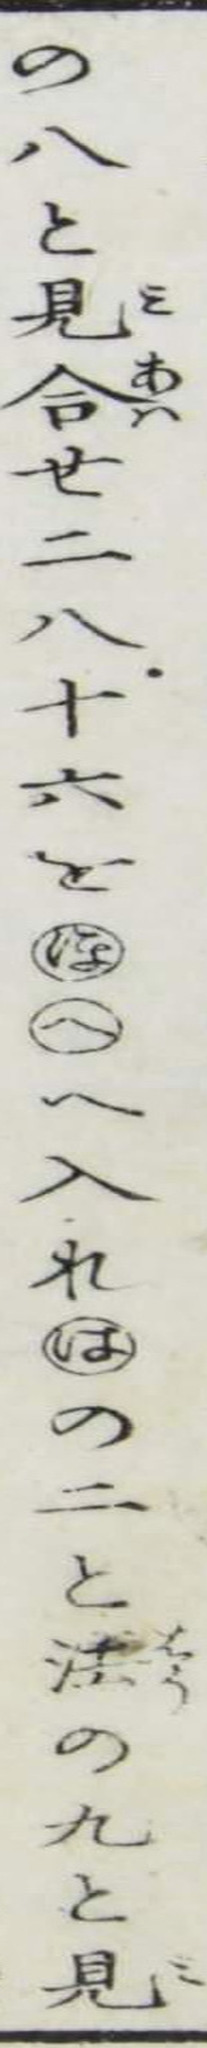の八と見合せ二八．十六を㋭㋬へ入れ㋩の二と法の九と見
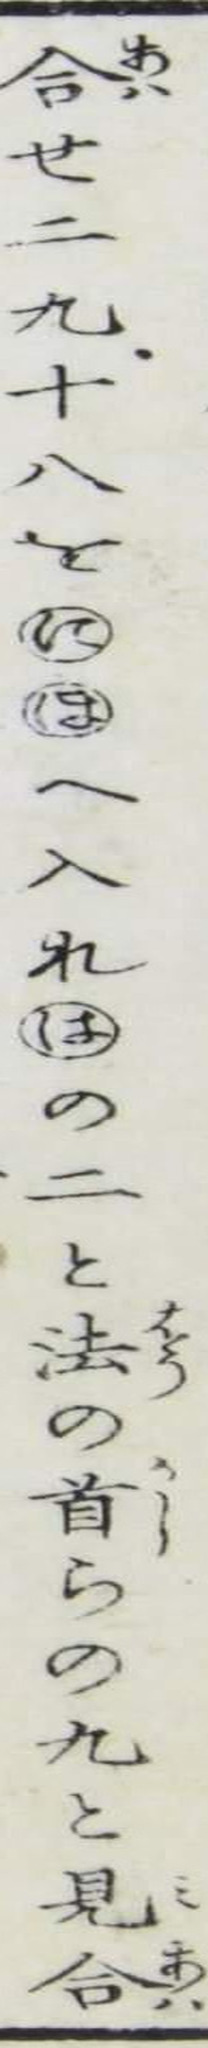合せ二九．十八を㋥㋭へ入れ㋩の二と法の首らの九と見合
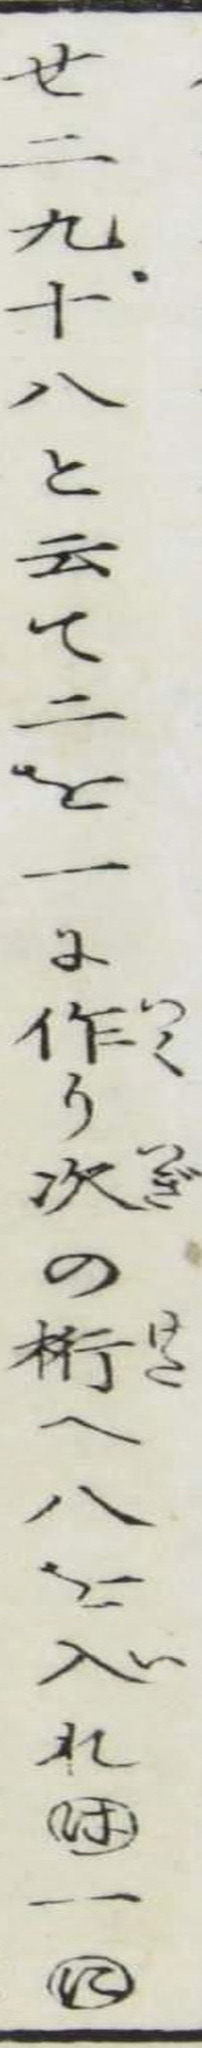せ二九．十八と云て二を一に作り次の桁へ八を入れ㋩一㋥
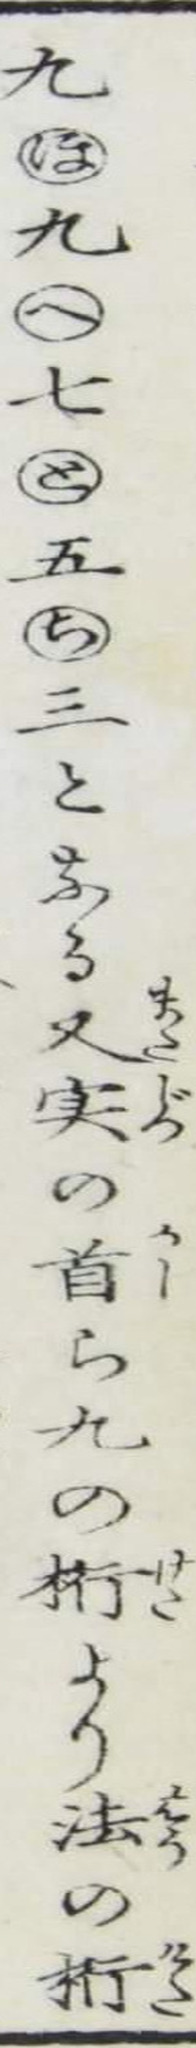九㋭九㋬七㋣五㋠三となる又実の首ら九の桁より法の桁
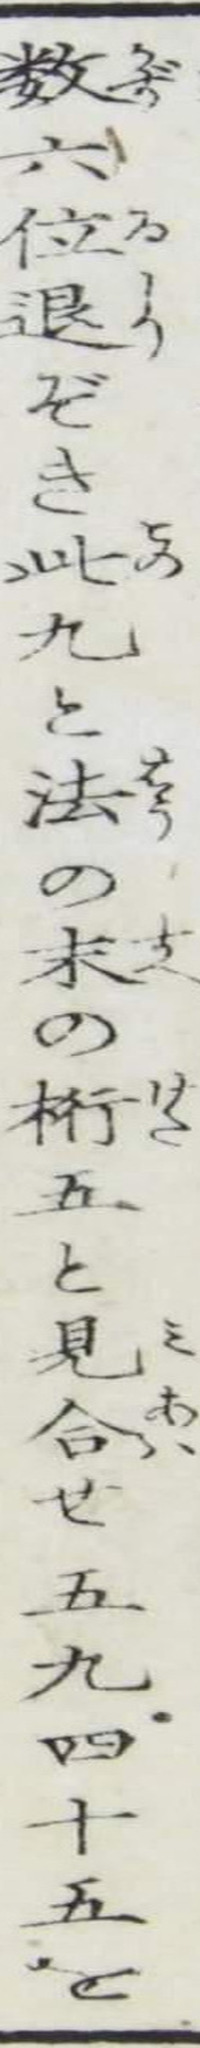数六位退ぞき此九と法の末の桁五と見合せ五九．四十五を
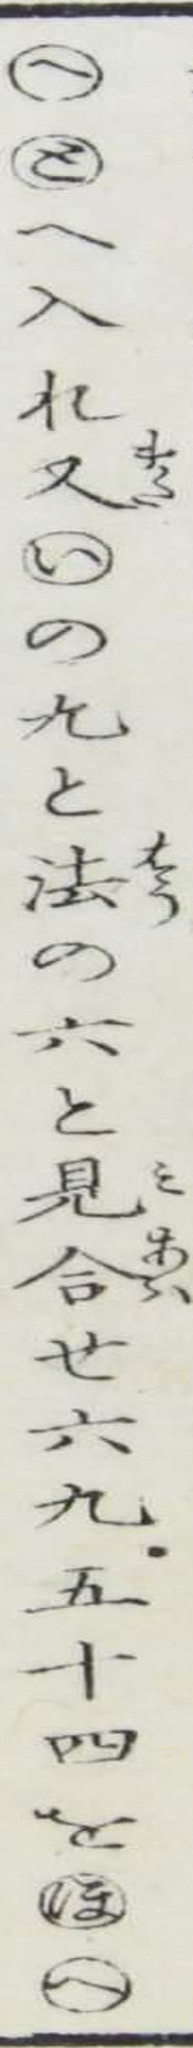㋬㋣へ入れ又㋑の九と法の六と見合せ六九．五十四を㋭㋬
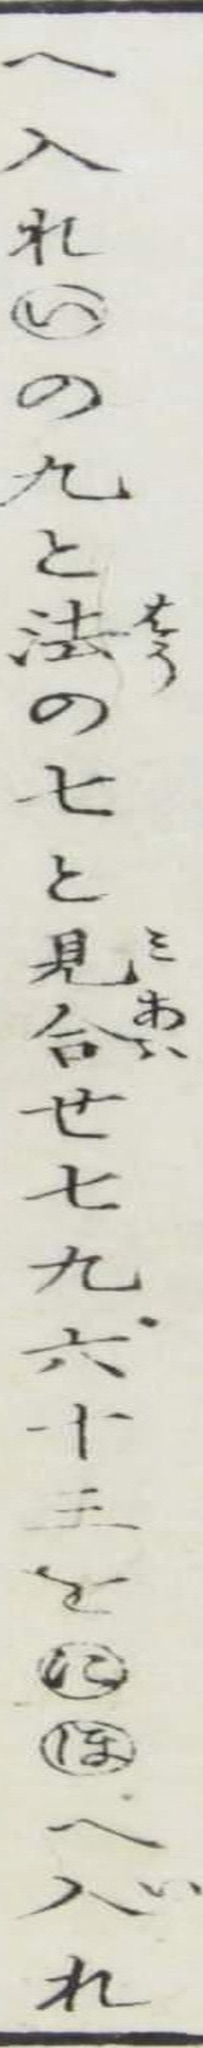へ入れ㋑の九と法の七と見合せ七九．六十三を㋥㋭へ入れ
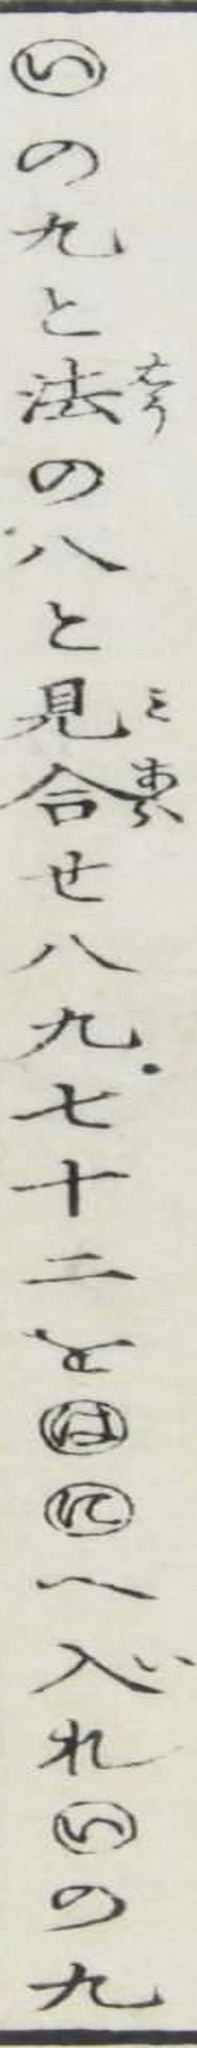㋑の九と法の八と見合せ八九．七十二を㋩㋥へ入れ㋑の九
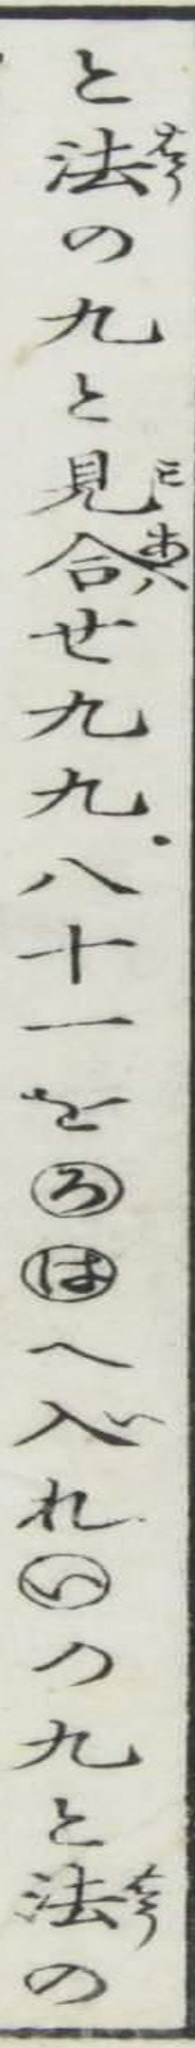と法の九と見合せ九九．八十一を㋺㋩へ入れ㋑の九と法の
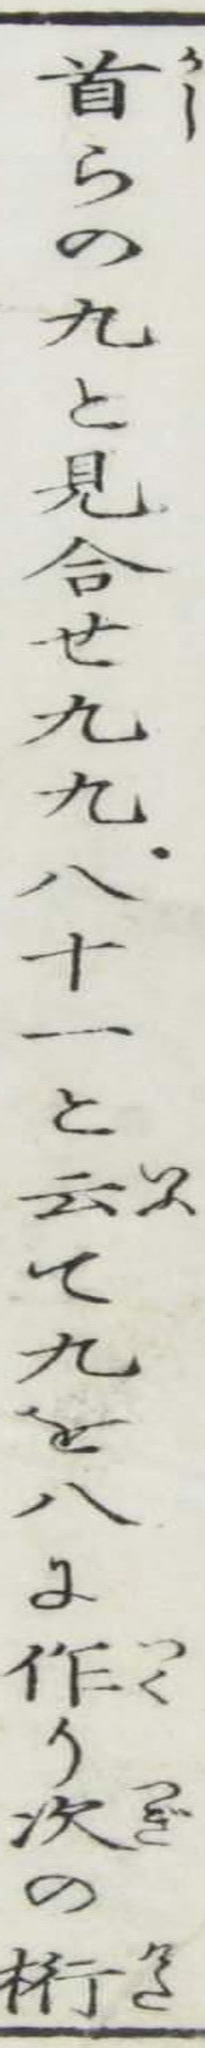首らの九と見合せ九九．八十一と云て九を八に作り次の桁
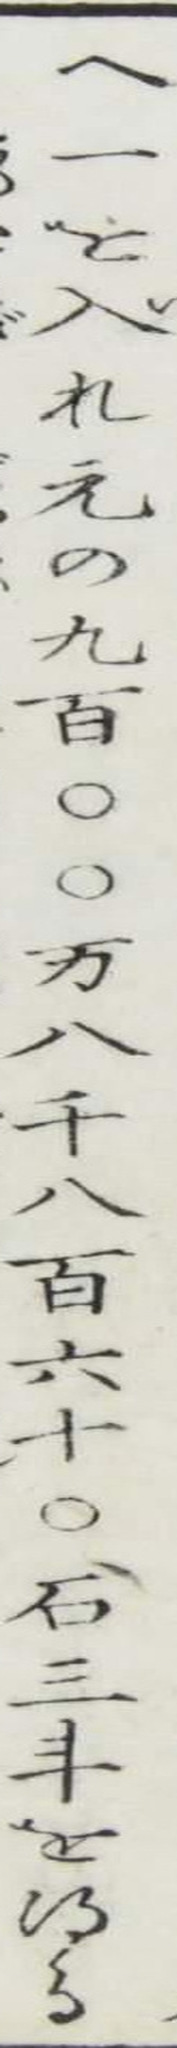へ一を入れ元の九百〇〇万八千八百六十〇石三斗を得る
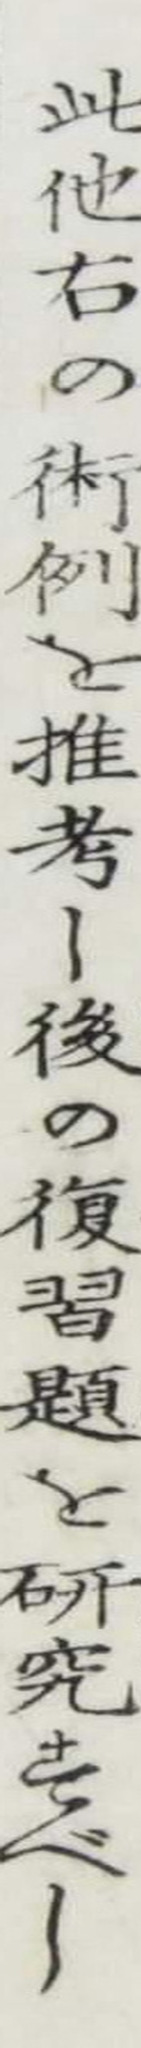此他右の術例を推考し後の復習題を研究すべし
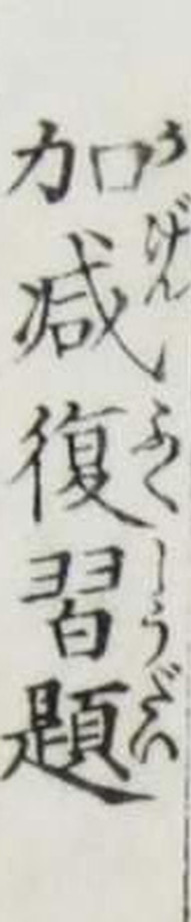加減復習題
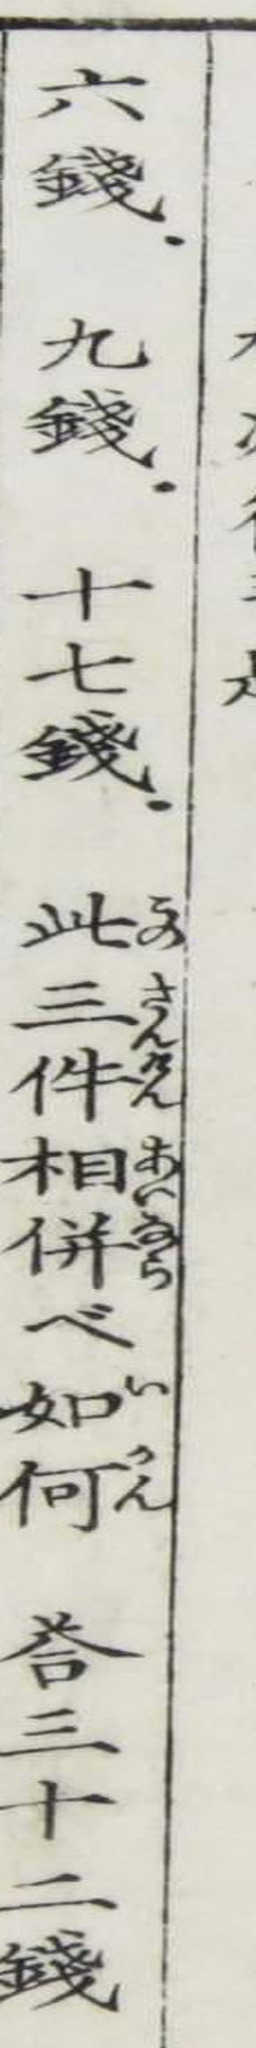六銭、九銭、十七銭、此三件相併べ如何答三十二銭

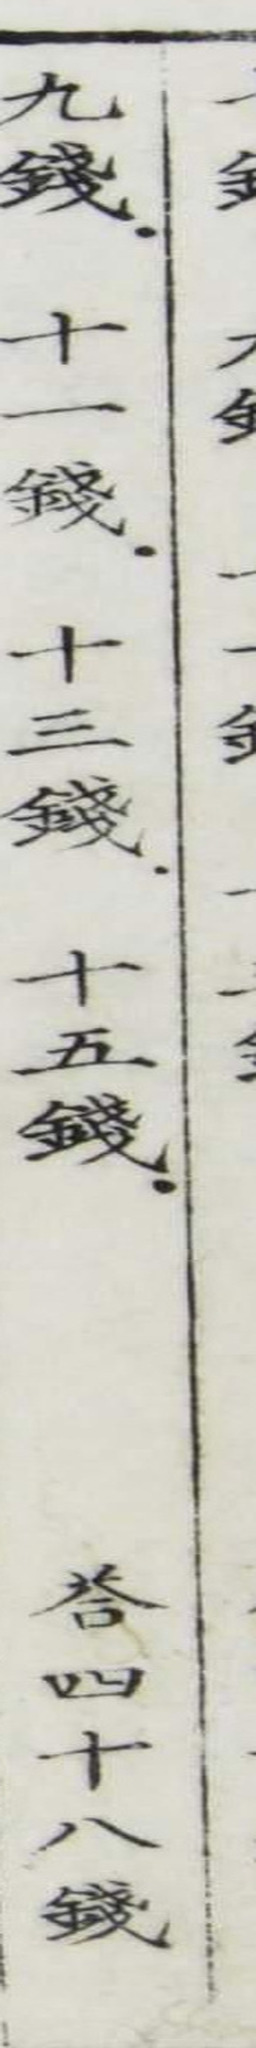九銭、十一銭、十三銭、十五銭、答四十八銭
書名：明治小學塵劫記 卷1
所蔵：東京学芸大学教育コンテンツアーカイブ
